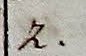2
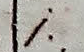1.
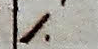1.
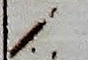1.
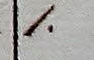1.
